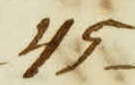45
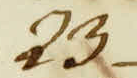23
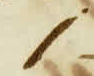1
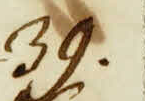39.
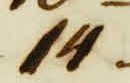14
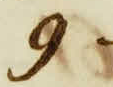9
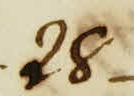28
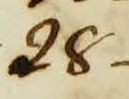28
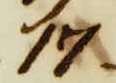17
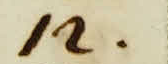12.
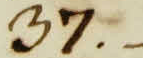37.
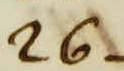26
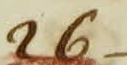26
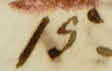15
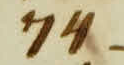74
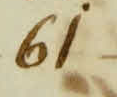61
